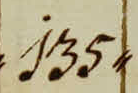135
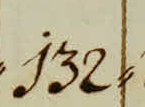132
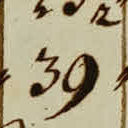39
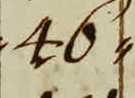46
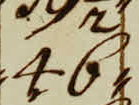46
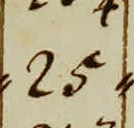25
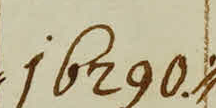16290.
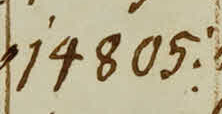14805
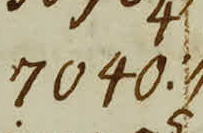7040.
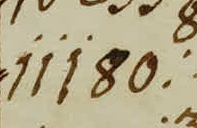11180.
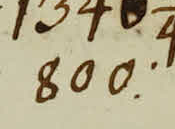800.
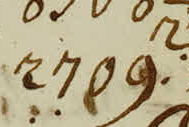2709
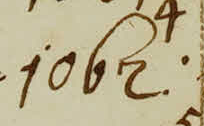1062.
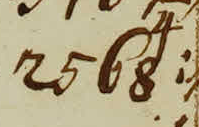2568
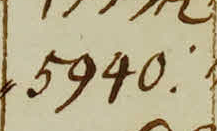5940.
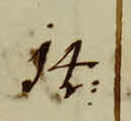14:
